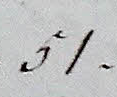51
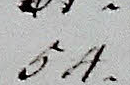54
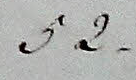52
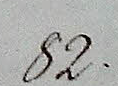82
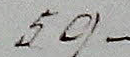59
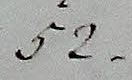52
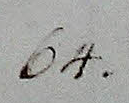64
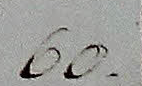60
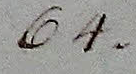64
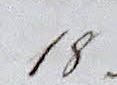18
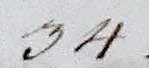34
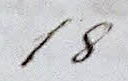18
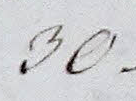30
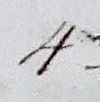4
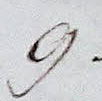9
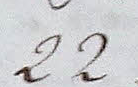22
